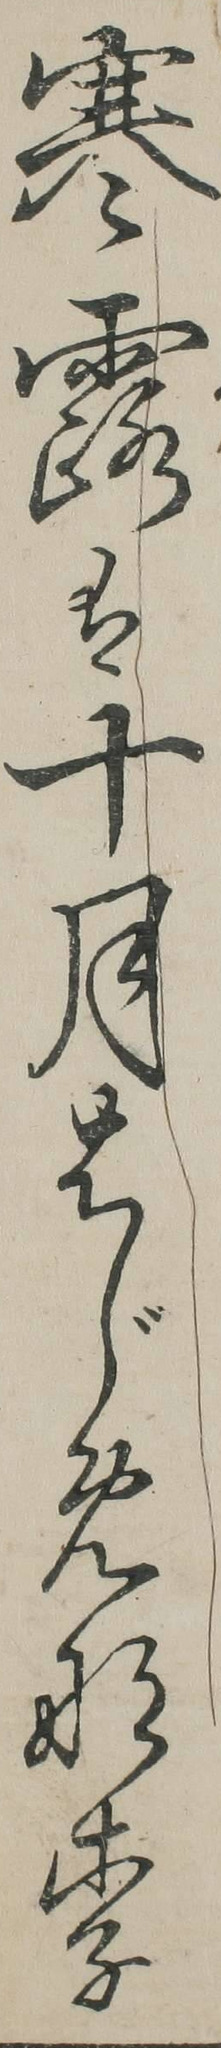寒露は十月ははじめなり
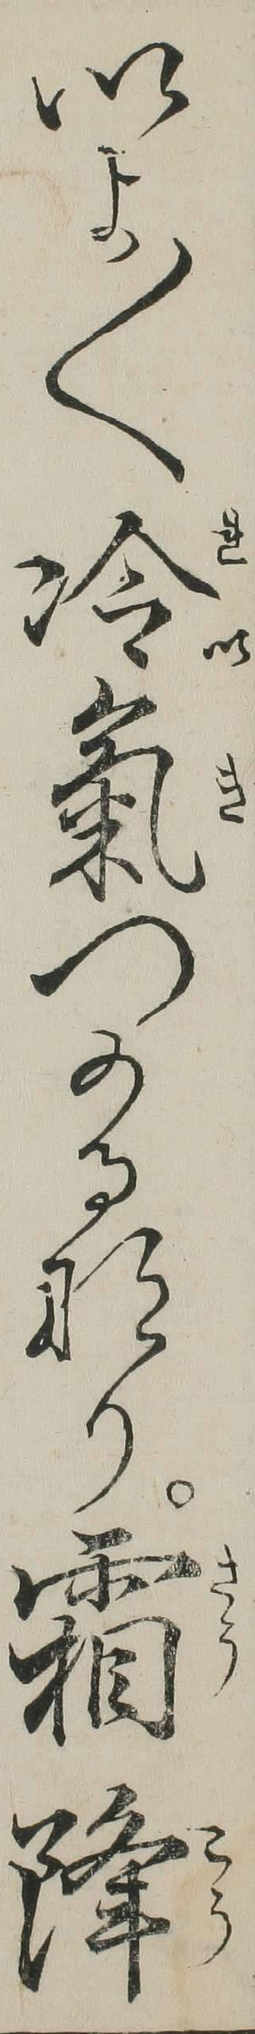いよ〳〵冷気つのるなり。霜降
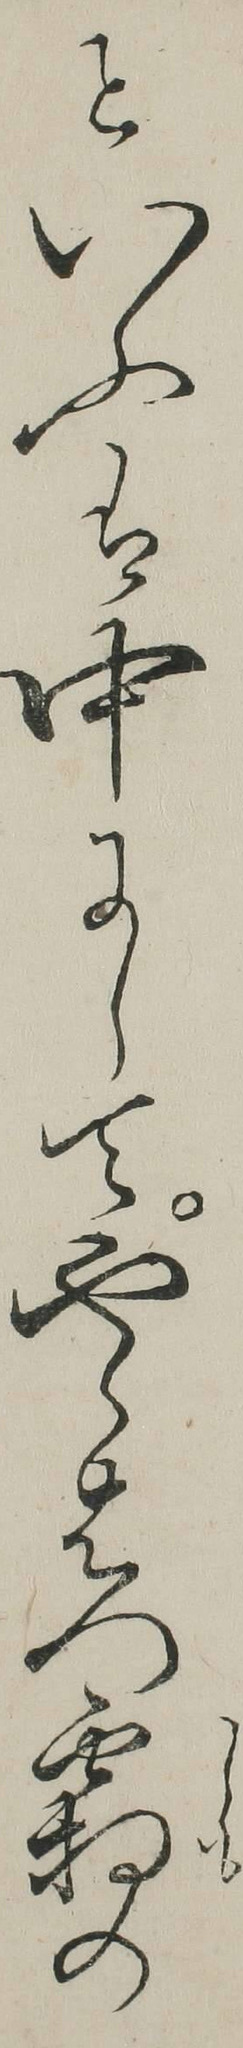といふは中にして。やゝはつ霜の
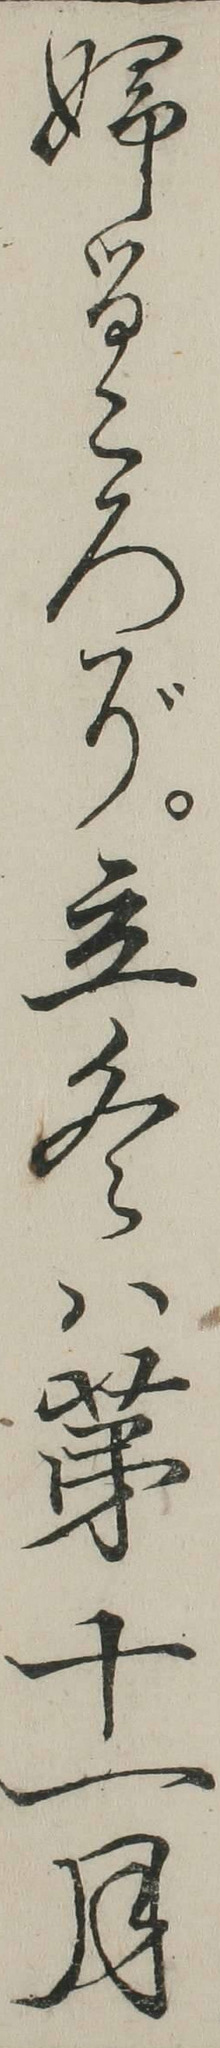ふるころぞ。立冬は第十一月。
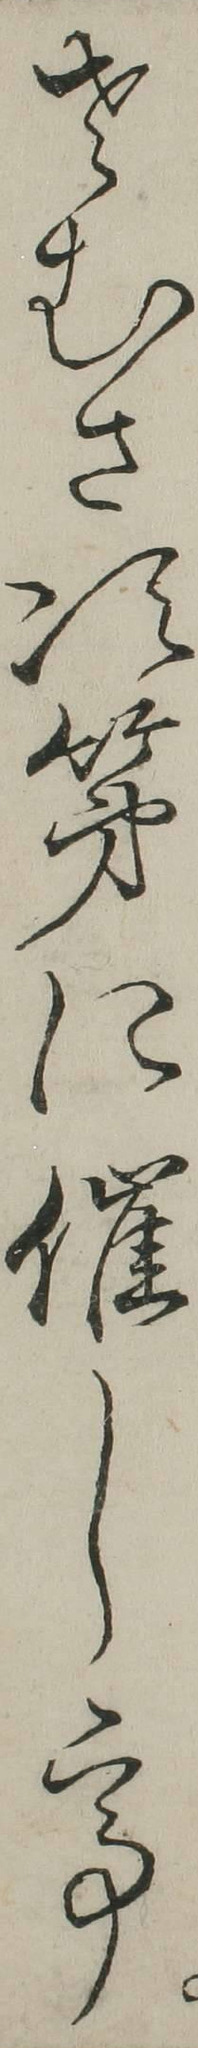さむさ次第に催して。

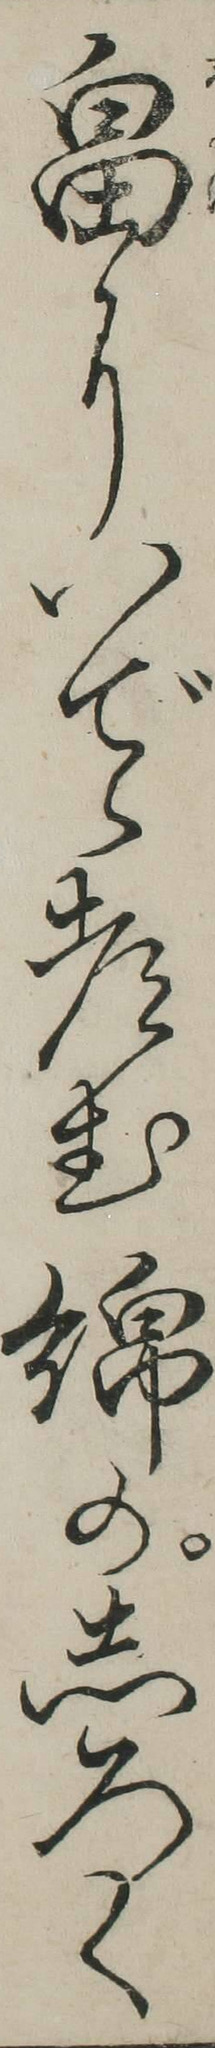畠にいでゝつむ綿の。しろく
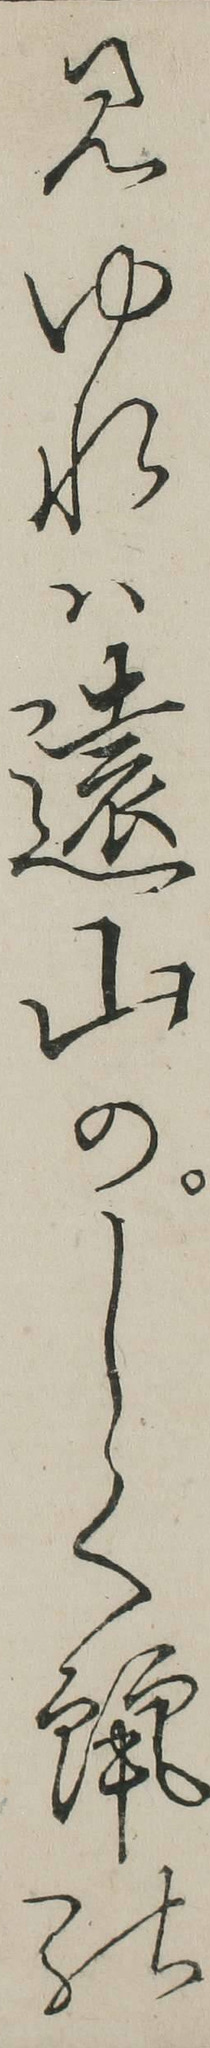見ゆれは遠山の。しくれの
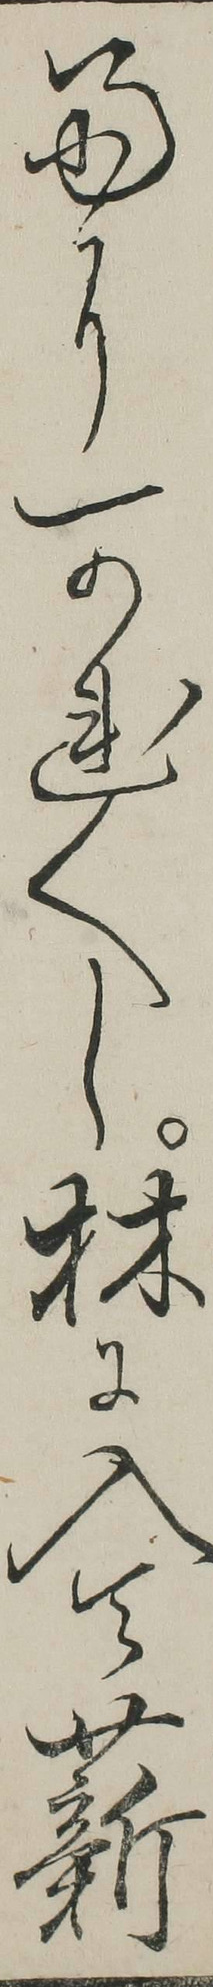雨にかれ〳〵し。林に入て薪
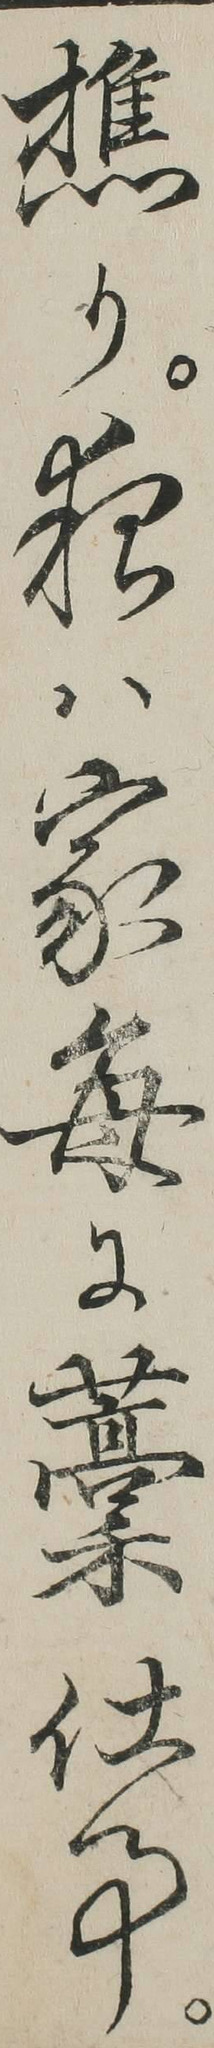樵り。夜は家毎に藁仕事。
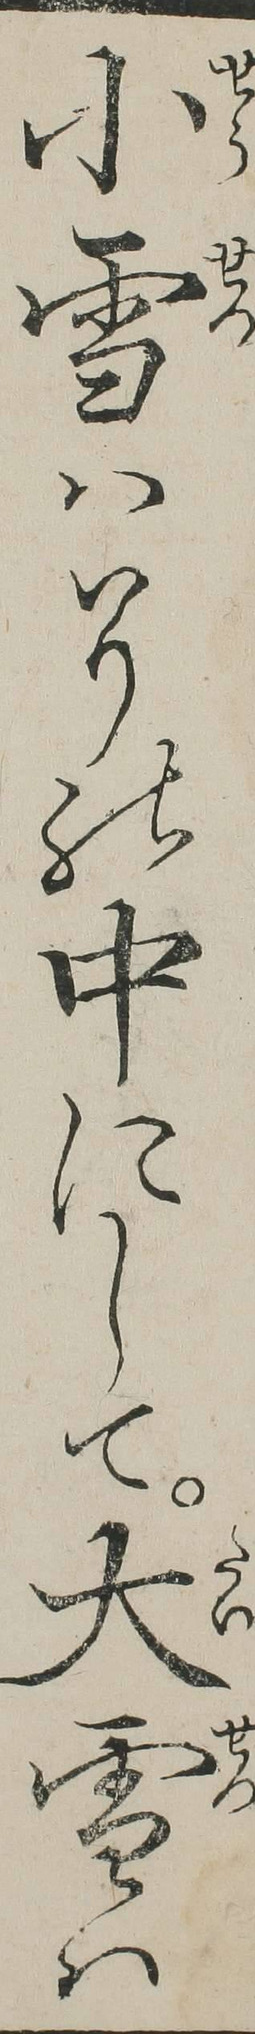小雪はその中にして。大雪は
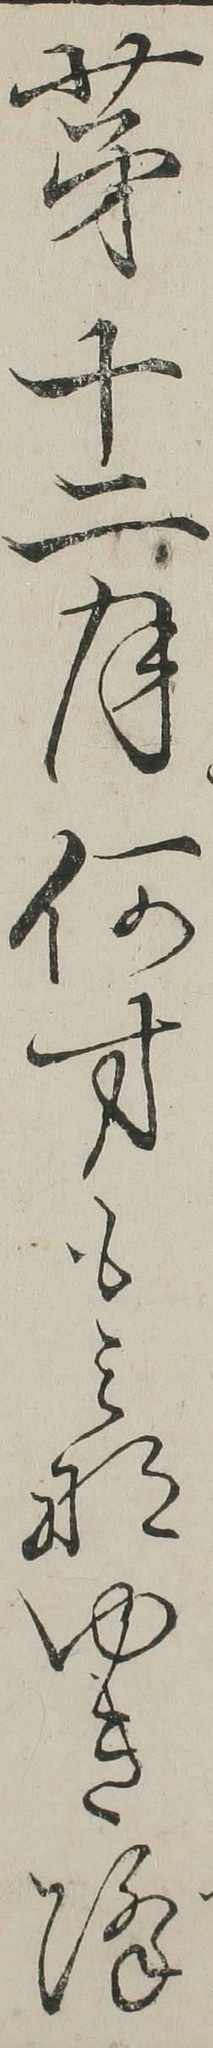第十二月。何方もみなゆき降
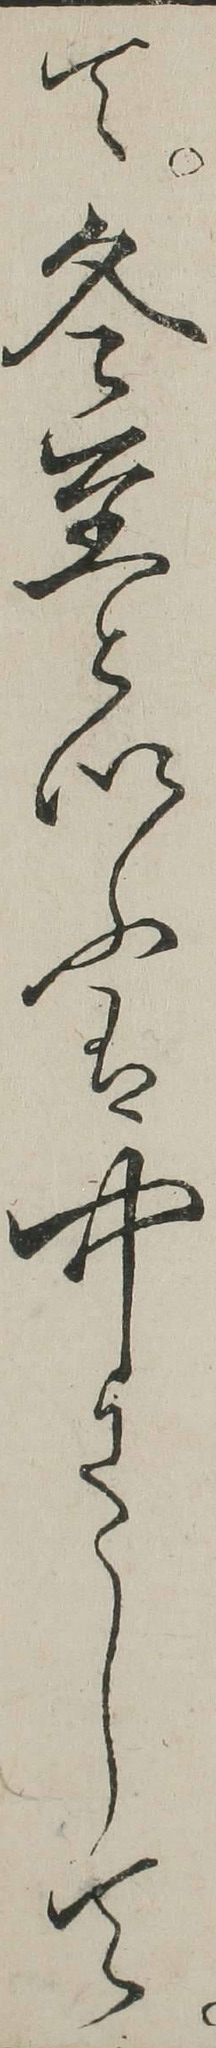て。冬至といふは中にして。
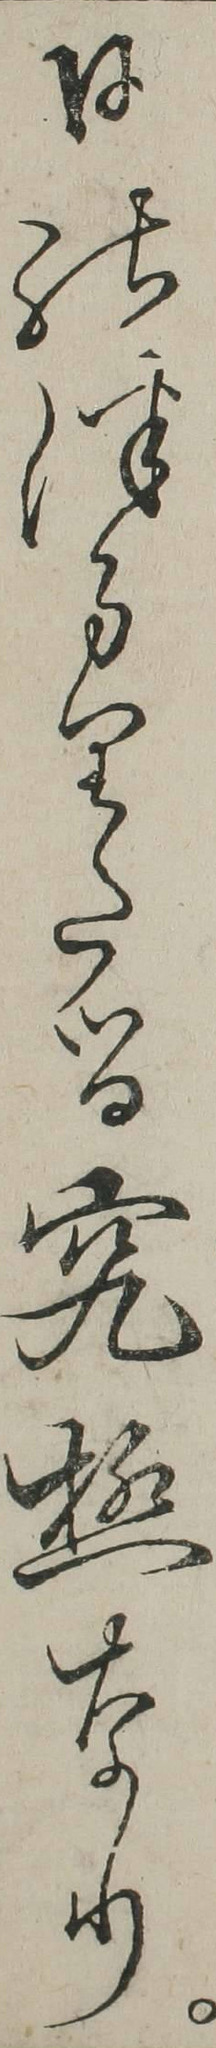日のつまりたる究極なり。

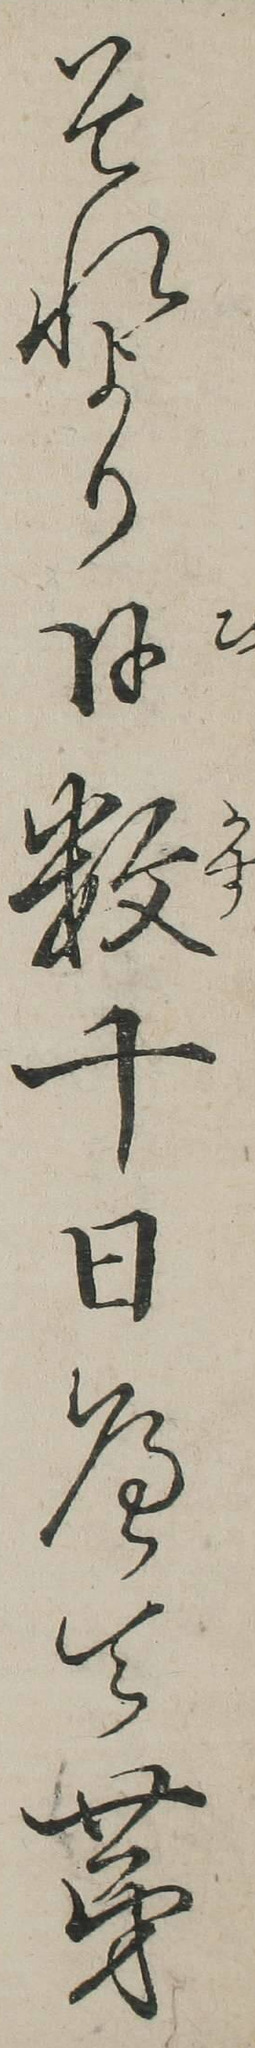それより日数十日へて第
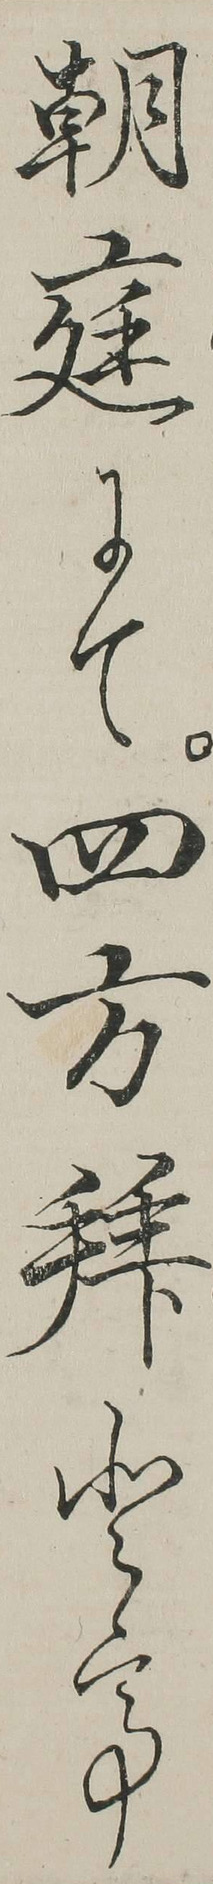朝廷にて。四方拝とて
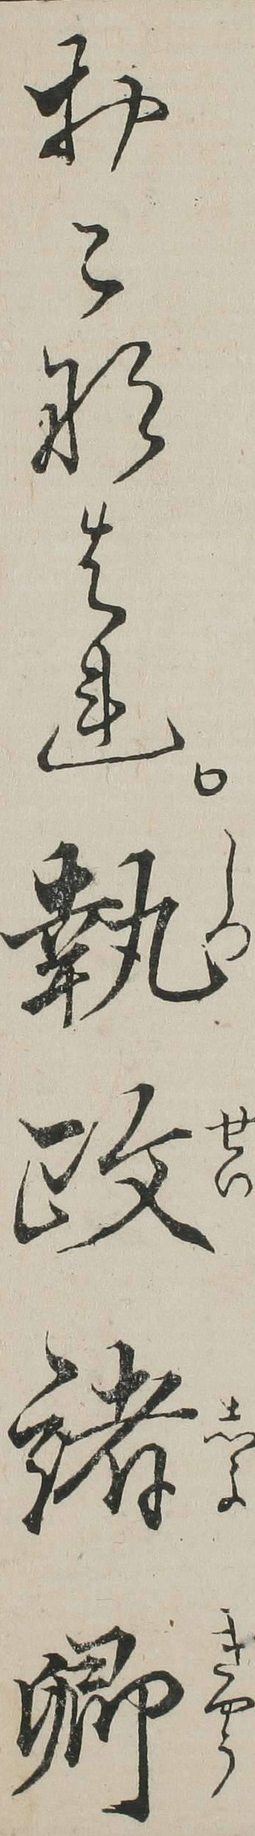おこなはれ。執政諸卿
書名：農蠶必要日読往来
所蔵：東京学芸大学附属図書館 国文学研究資料館
